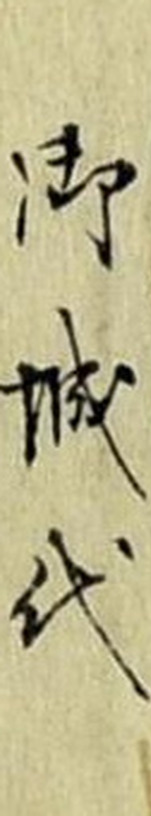御城代
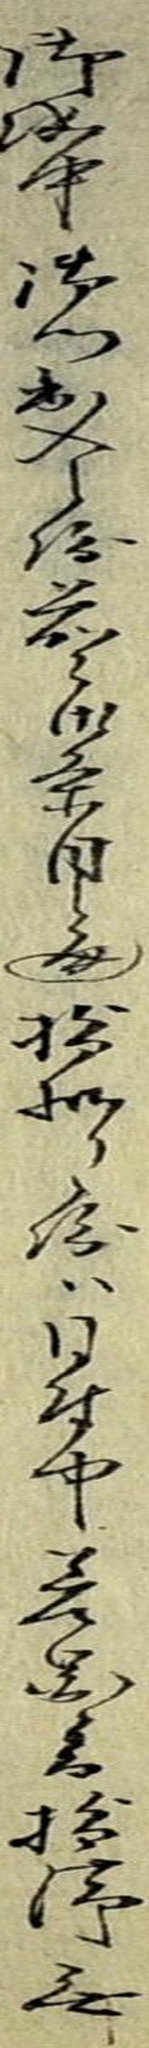〇御城中御門出入之儀前々御条目之通指掛り之儀ハ目付中差図ニ而指滞無
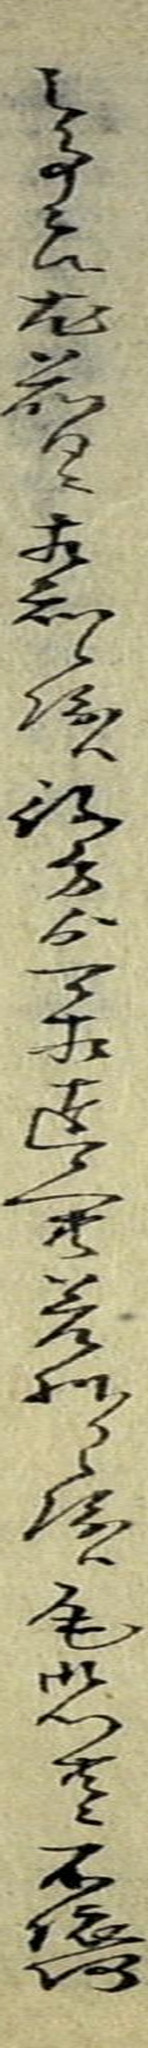之事ニ候尤前日ニ相知候儀ハ役方ゟ可相達候へ共差掛り候儀ハ瓦御門共ニ不依何
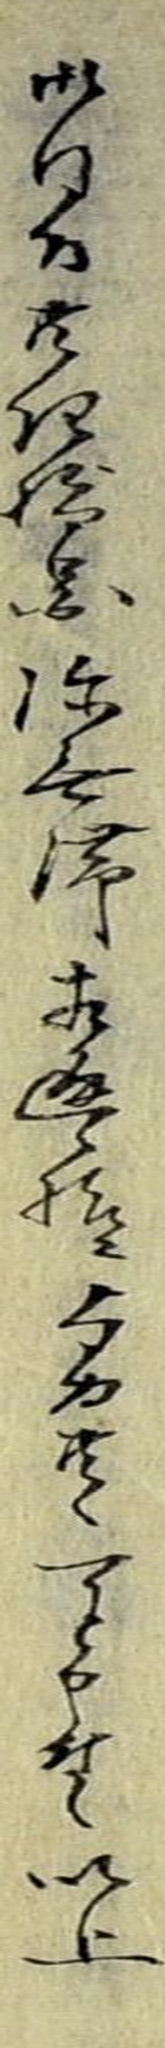御目付共任指図弥無滞相通候様ニ与力共へ可被申付候以上
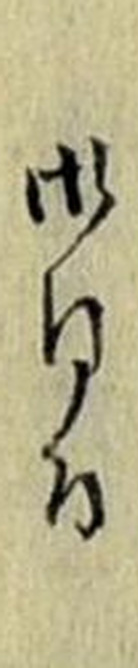御目付
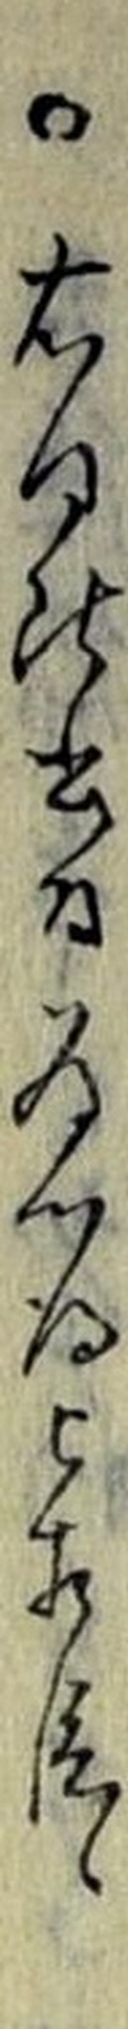〇右同断書付為心得被相渡候
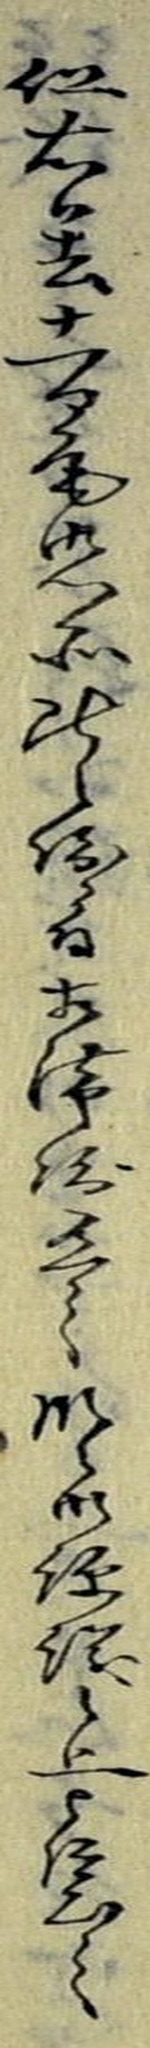但右ハ去十一日瓦御門所断之儀ニ付相滞儀有之段々御評議之上被仰出之
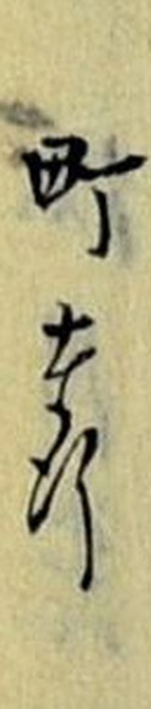町奉行
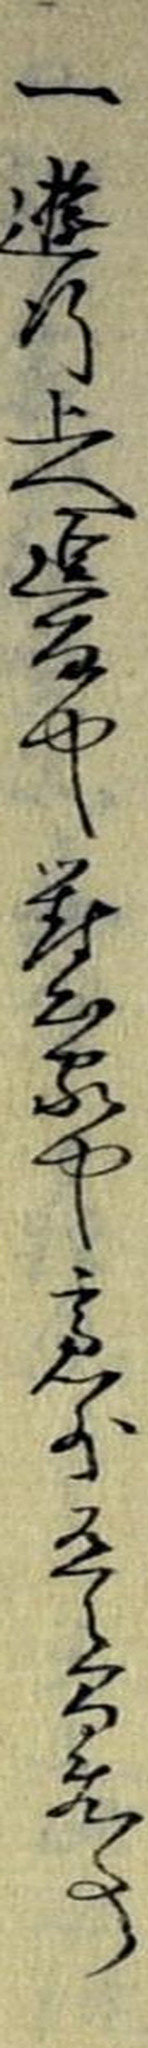一遊行上人逗留中対出家中慮外有之間敷事
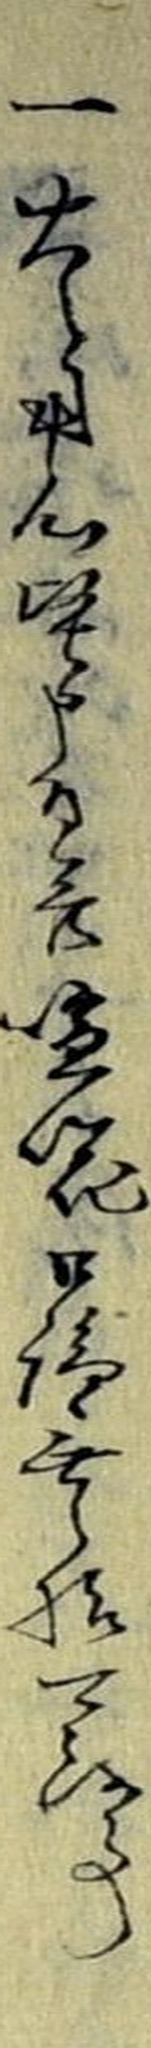一火之用心堅申付候并喧嘩口論無之様可致事
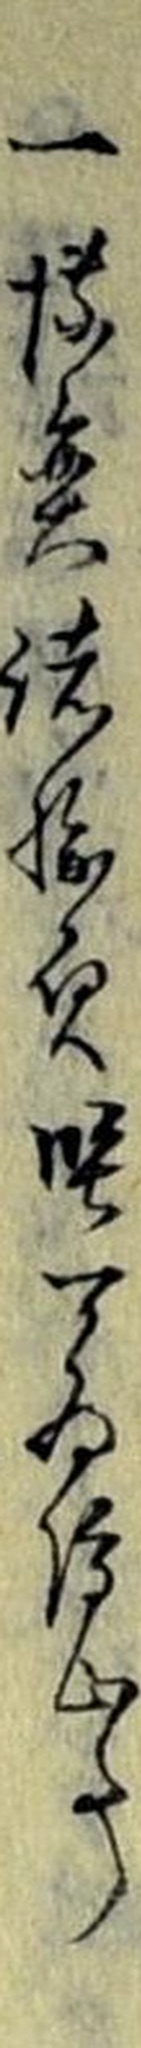一博奕諸勝負堅可為停止事
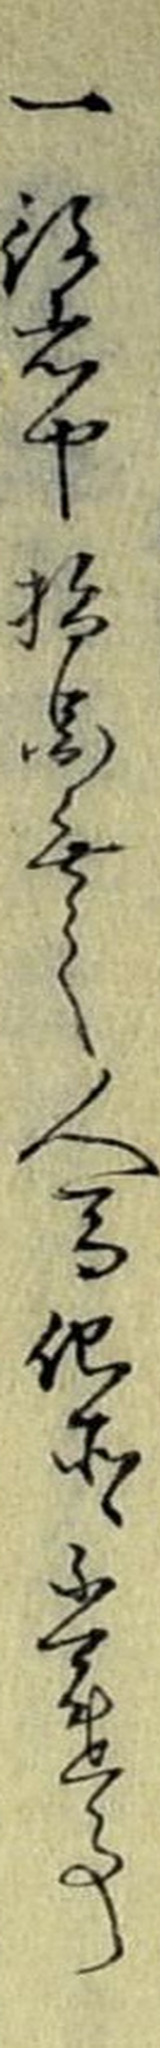一役者中指図無之人馬他所へ不可遣事
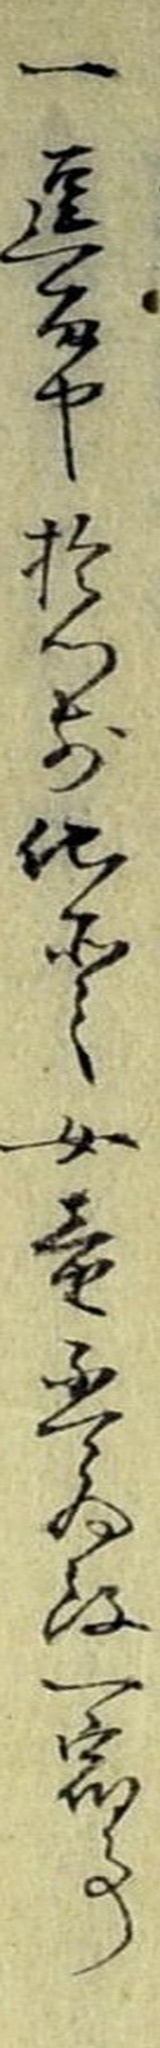一逗留中於門前他所之女童不可為致一宿事
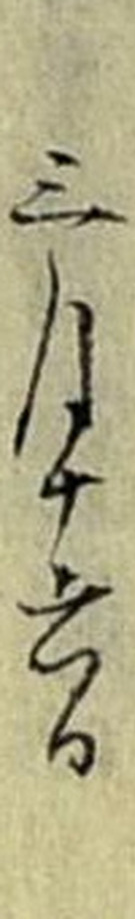三月十六日
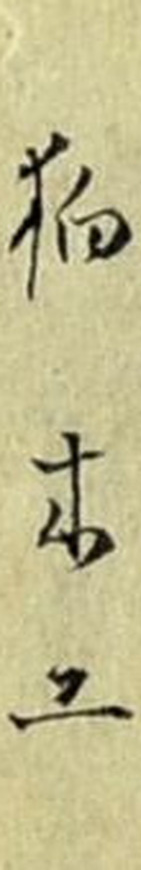狛木工
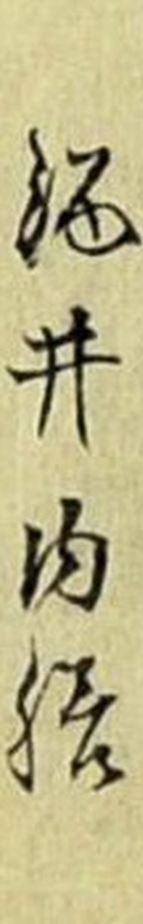酒井内膳
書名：命令之部 一
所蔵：福井県文書館 Fukui Prefectural Archives
